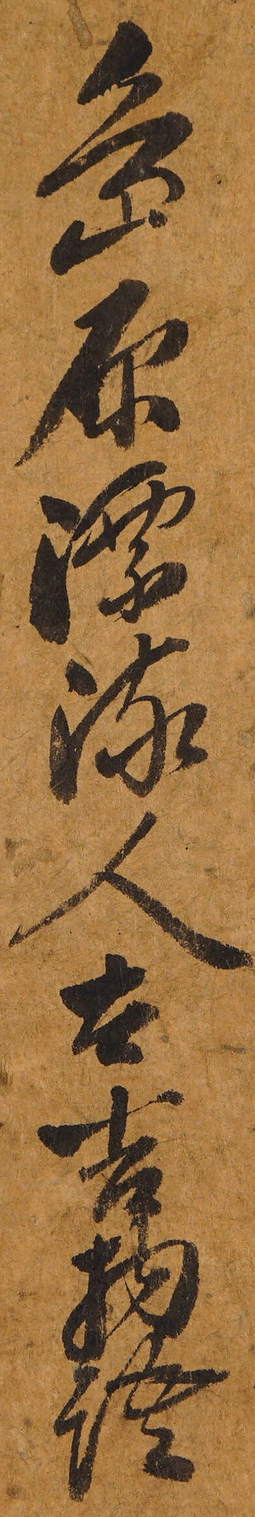島原漂流人太吉物語

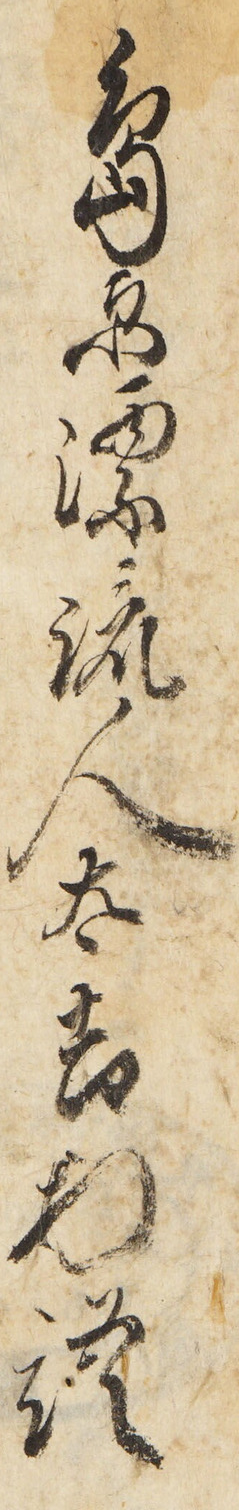島原漂流人太吉物語
